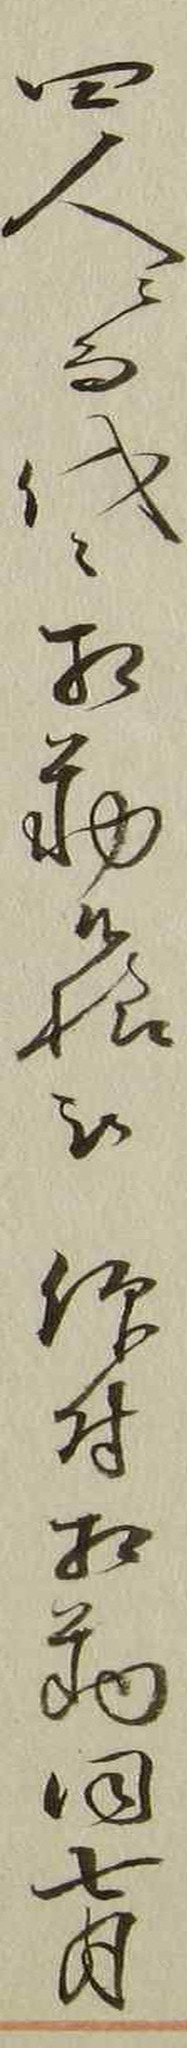四人ニ而代々相勤候様被仰付相勤同七月
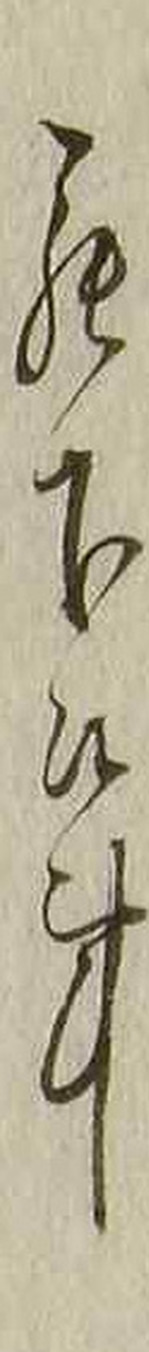罷下候事
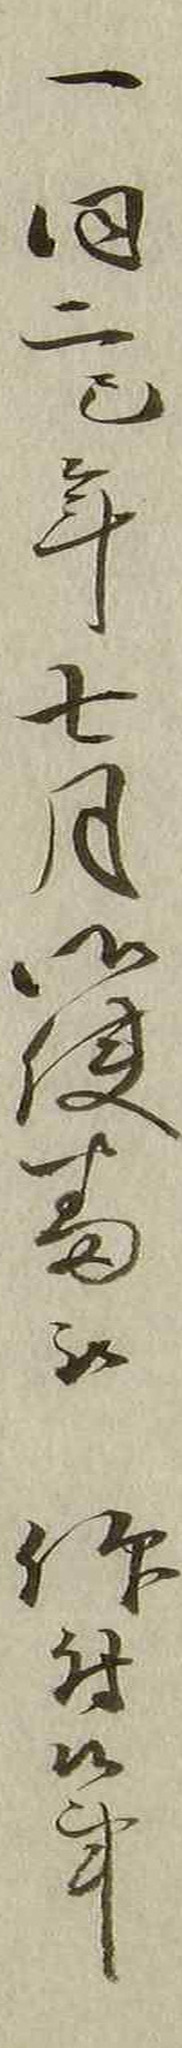一同二巳年七月御使番被仰付候事
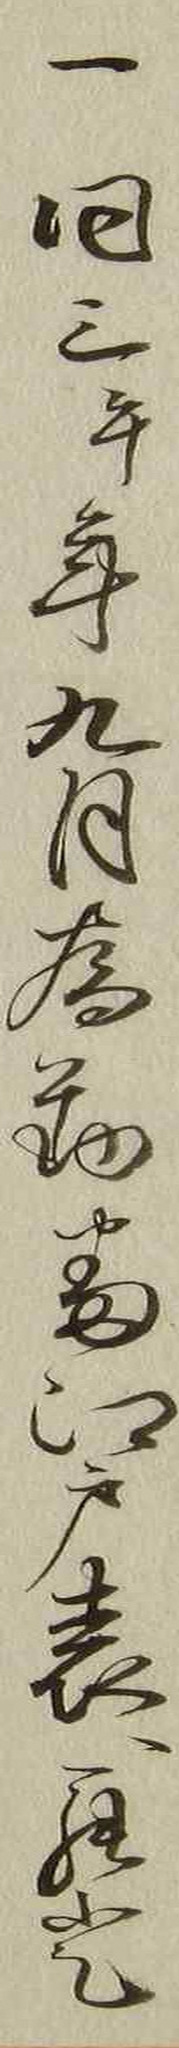一同三午年九月為勤番江戸表へ罷登
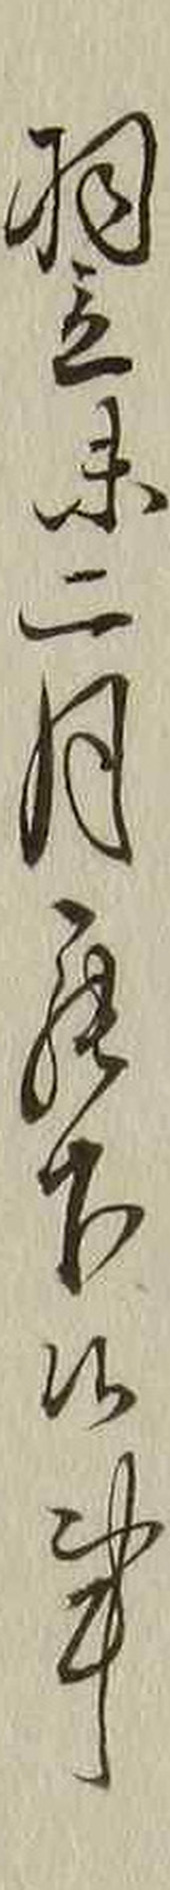翌未二月罷下候事
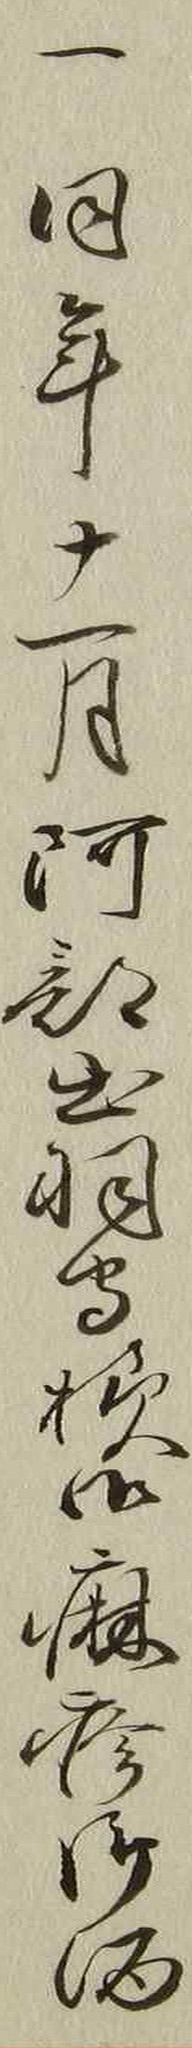一同年十一月阿部出羽守様御麻疹御酒
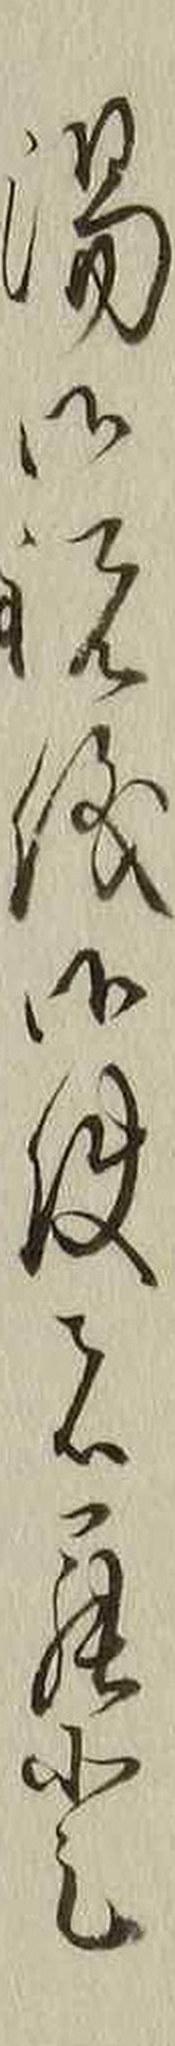湯御祝儀御使者罷登
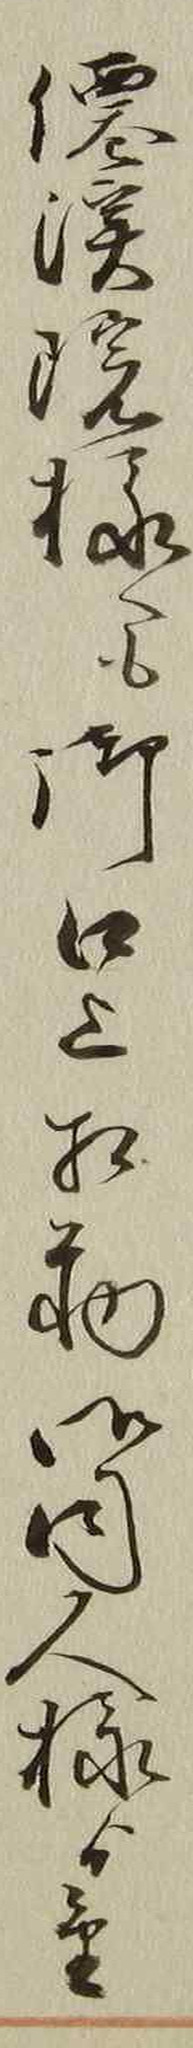仙渓院様へも御口上相勤御同人様ゟ金
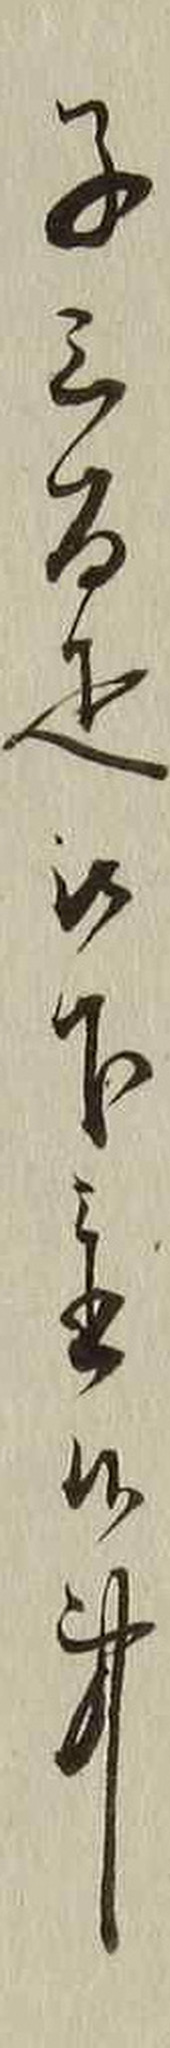子三百疋被下置候事
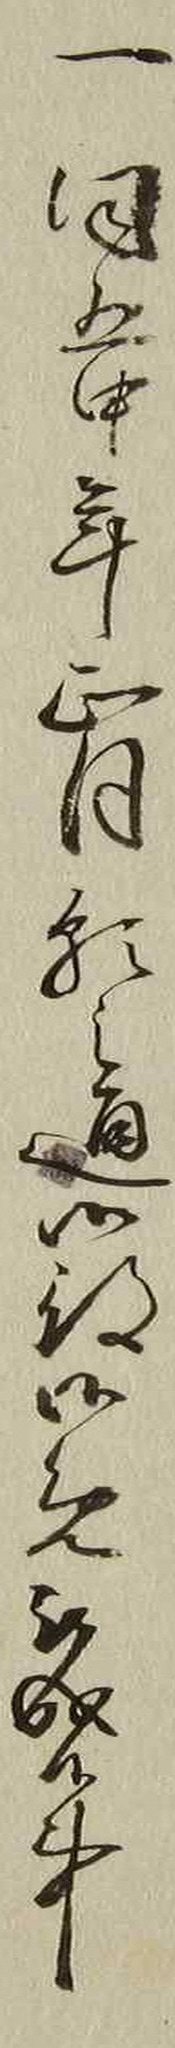一同五申年正月願之通御役御免被成候事
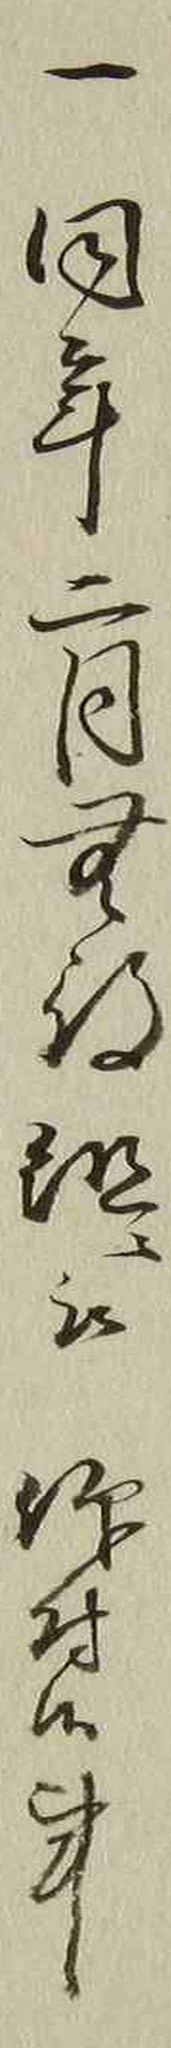一同年二月無役組ニ被仰付候事
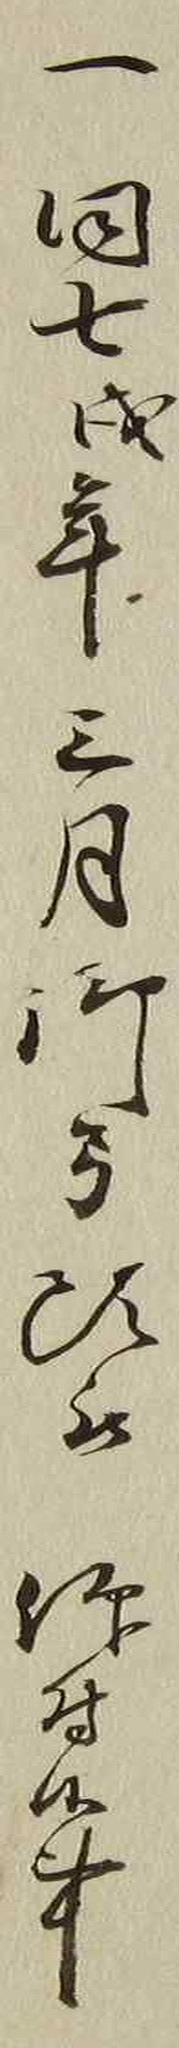一同七戌年三月御弓頭被仰付候事
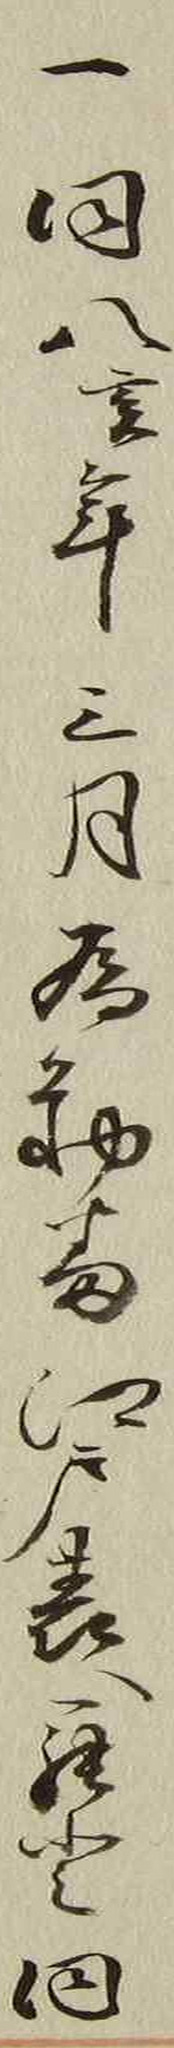一同八亥年三月為勤番江戸表へ罷登同
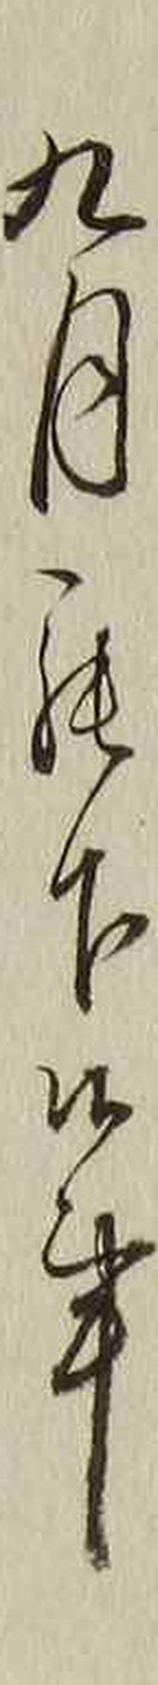九月罷下候事
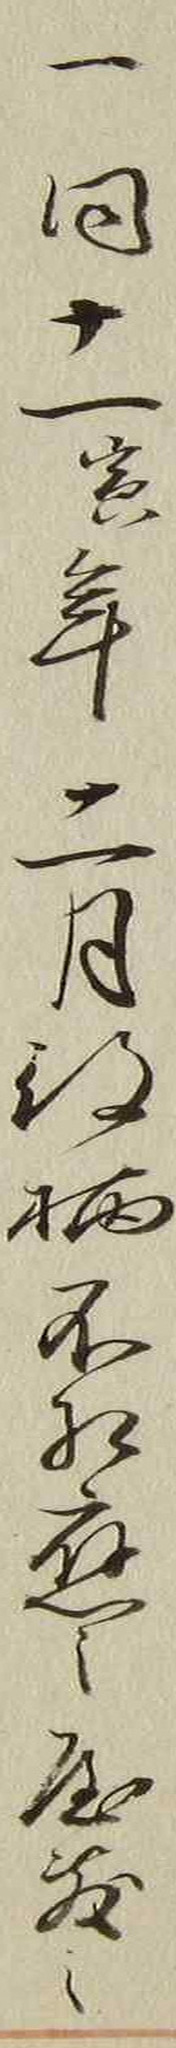一同十一寅年十一月役柄不相応之屋敷之
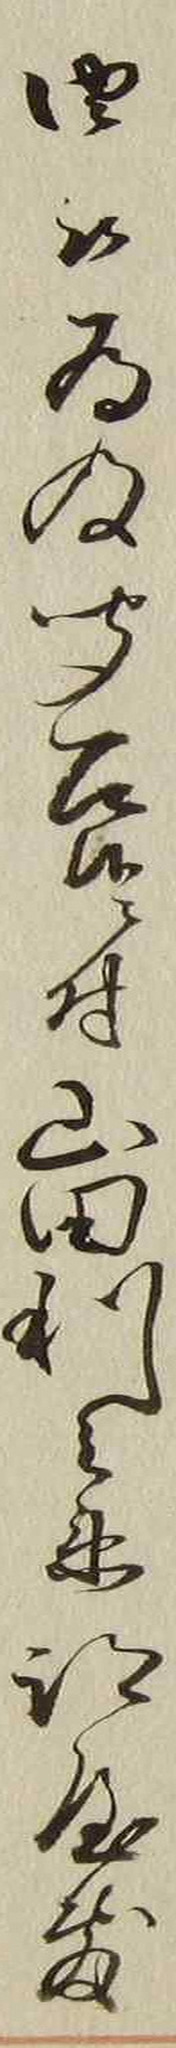由被為及聞召候ニ付山田利兵衛跡屋敷
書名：諸士系譜　巻之122　よ之部5
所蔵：会津若松市立会津図書館
